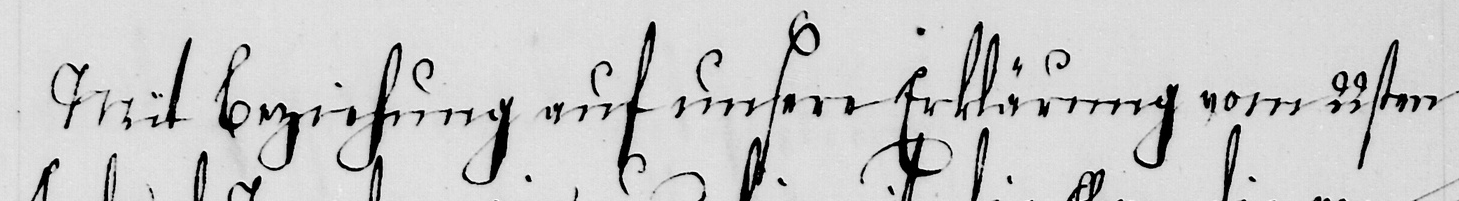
Mit Beziehung auf unsere Erklärung vom 22sten
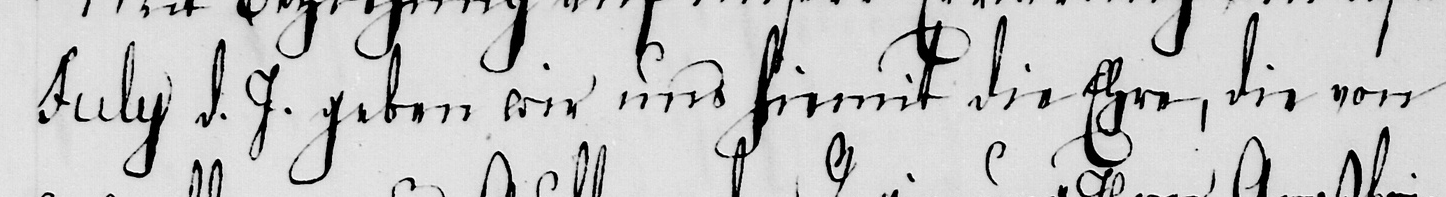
July d. J. geben wir uns hiemit die Ehre, die von
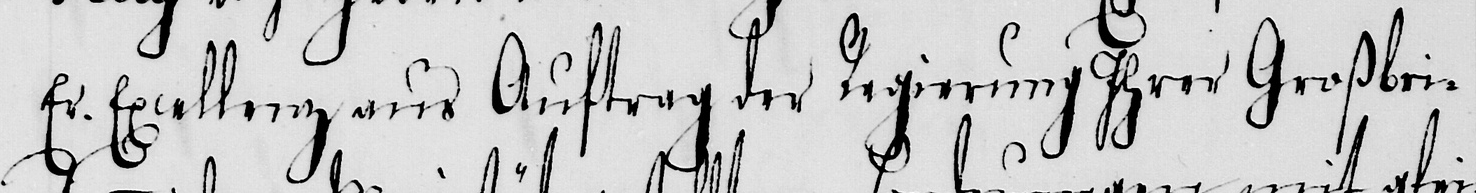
Er. Excellenz aus Auftrag der Regierung Ihrer Großbri¬
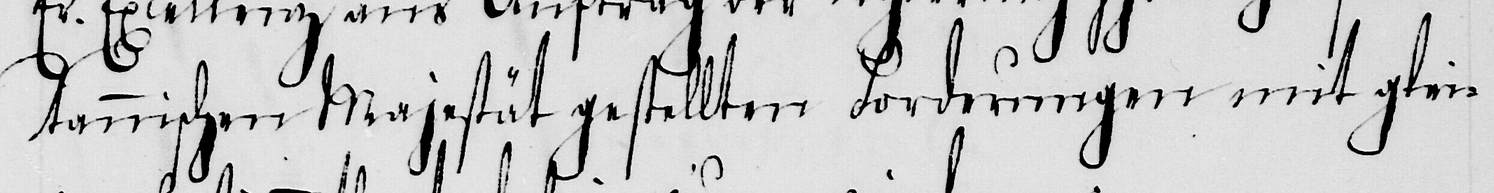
tannischen Majestät gestellten Forderungen mit glei¬
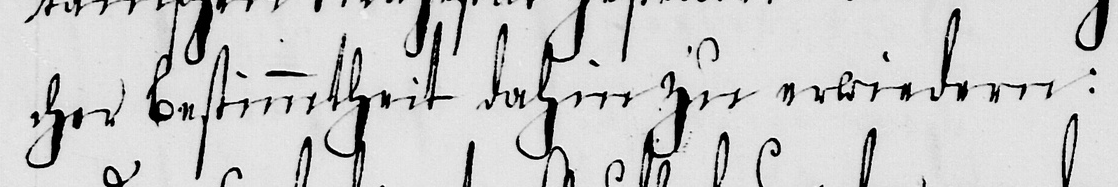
cher Bestimmtheit dahin zu erwiedern:
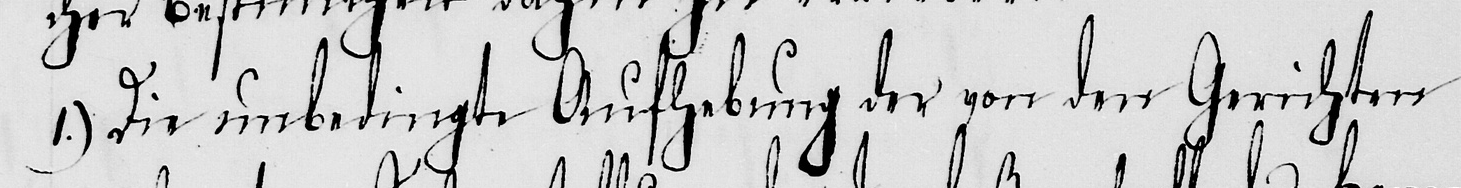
1.) Die unbedingte Aufhebung der von den Gerichten
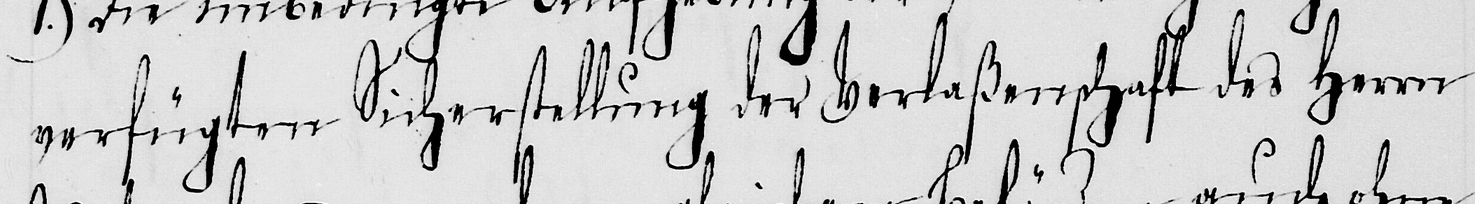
verfügten Sicherstellung der Verlaßenschaft des Herrn
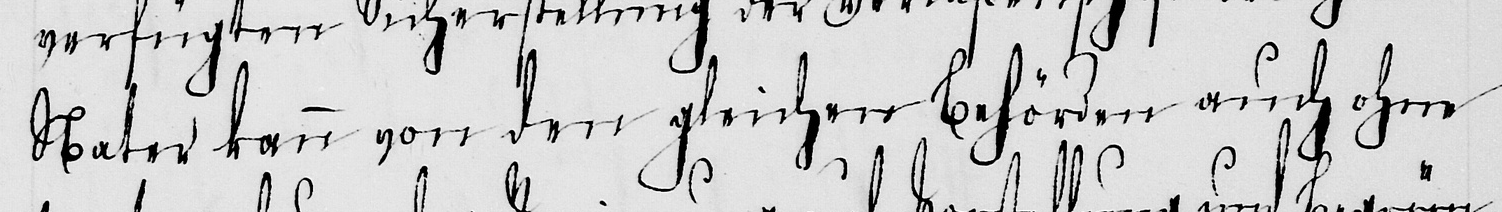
Nater kann von den gleichen Behörden auch ohne
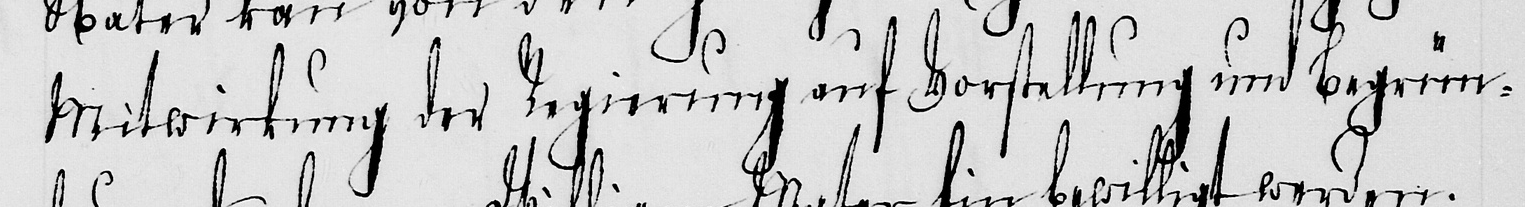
Mitwirkung der Regierung auf Vorstellung und Begrün¬
